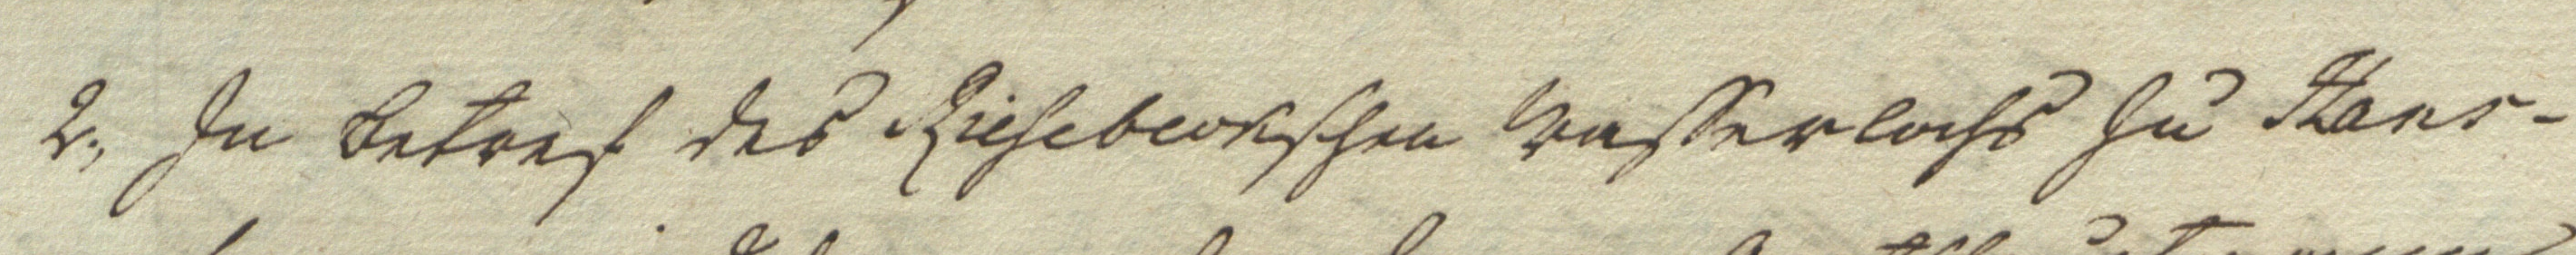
2., In Betref des Riesebeckschen Wasserlochs zu Hans¬
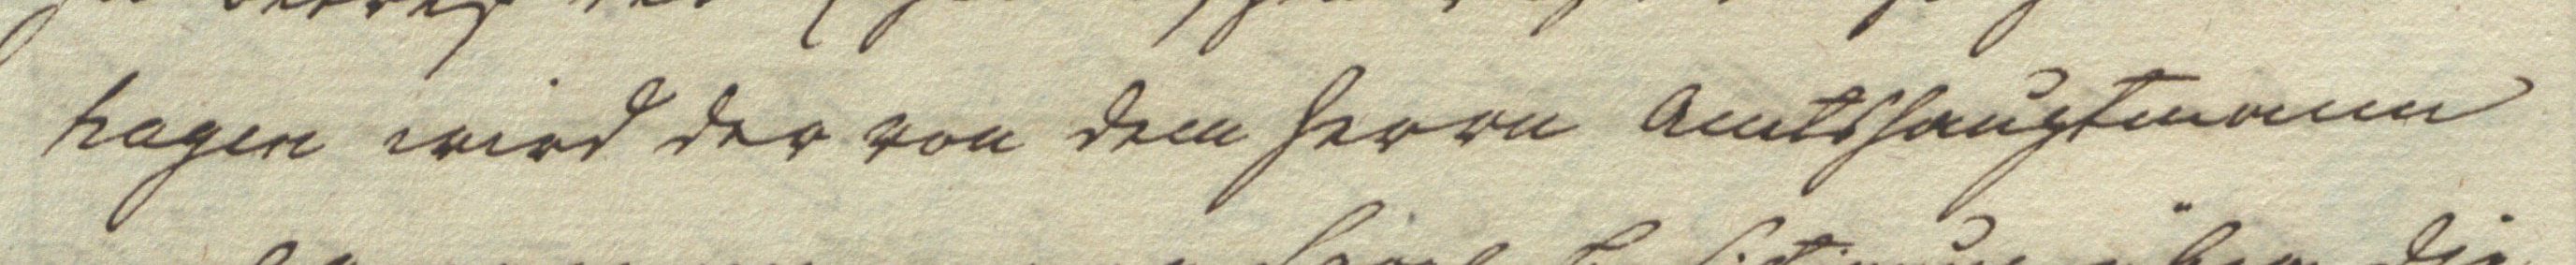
hagen wird der von dem Herrn Amtshauptmann
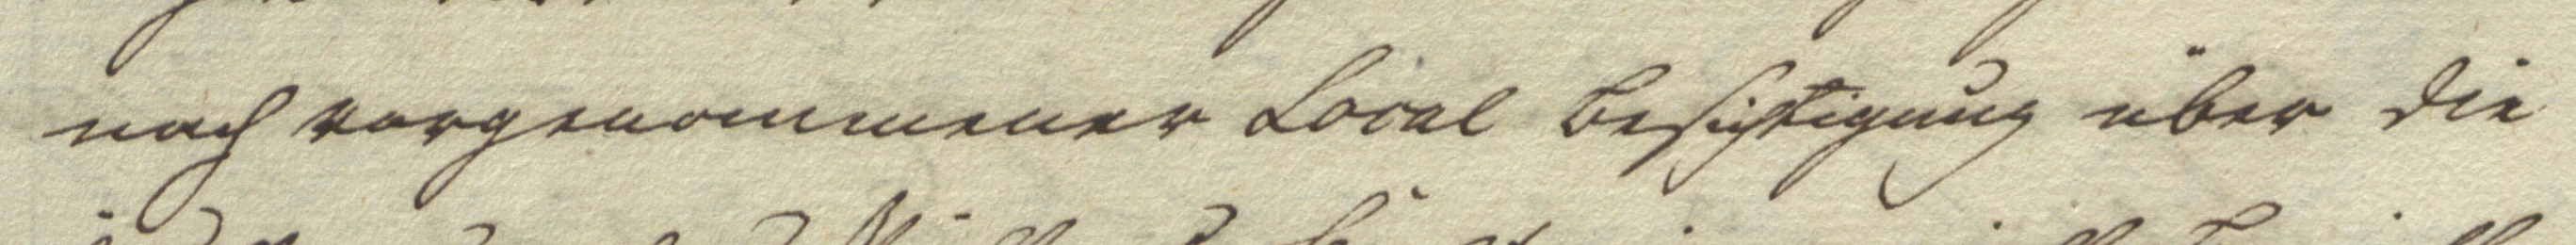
nach vorgenommener Local Besichtigung über die
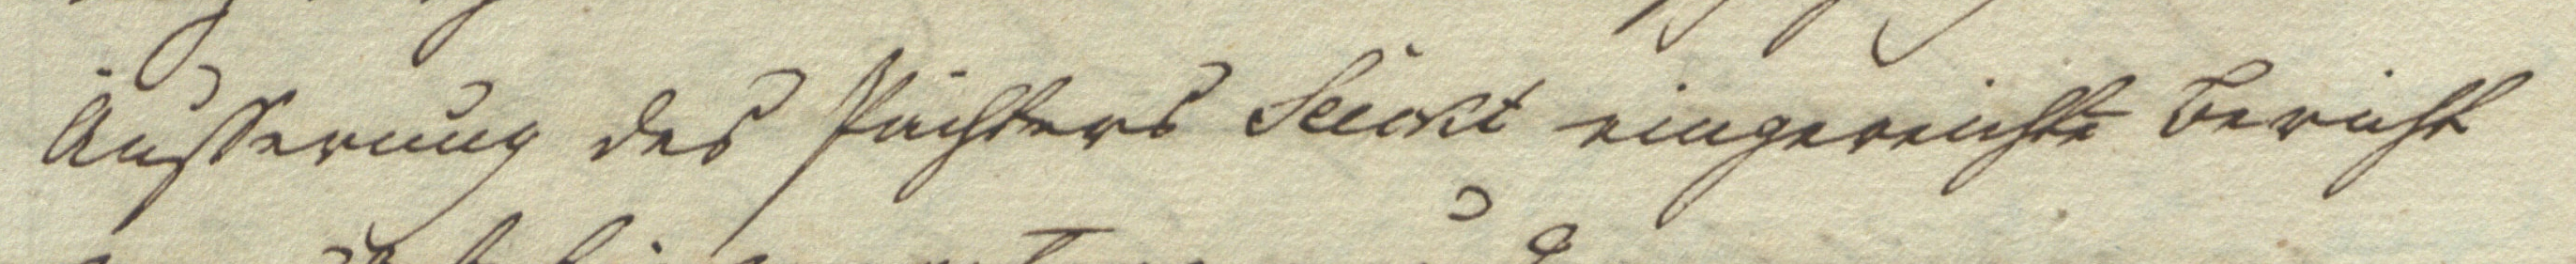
Äusserung des Pächters Seeckt eingereichte Bericht
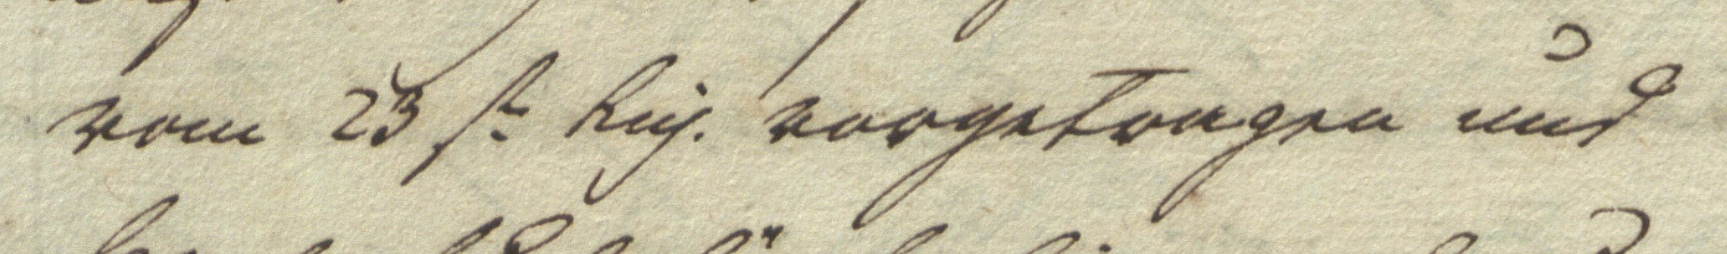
vom 23 t huj. vorgetragen und
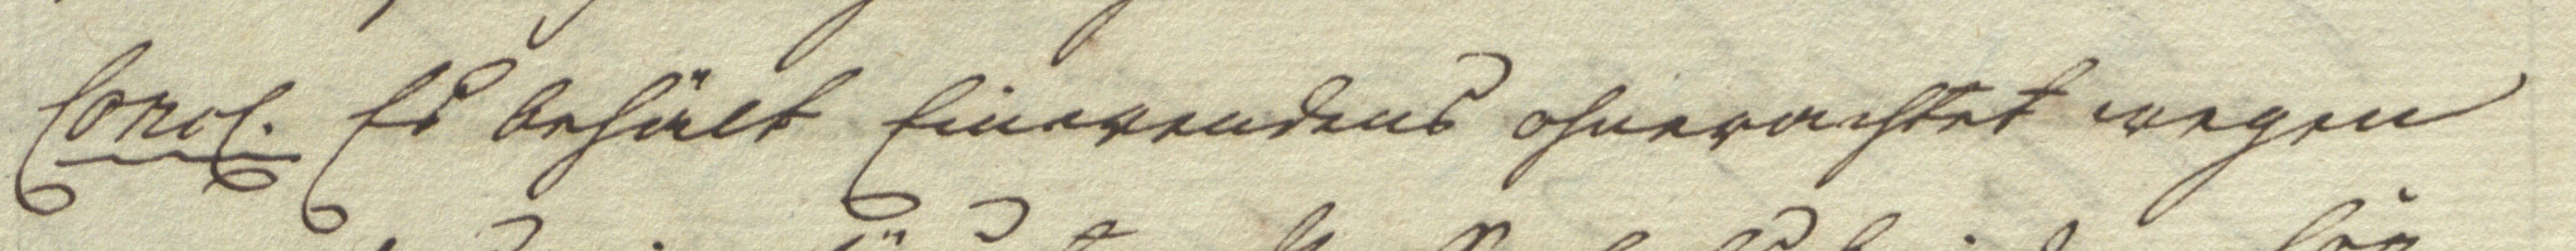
Concl. Es behält Einwendens ohnerachtet wegen
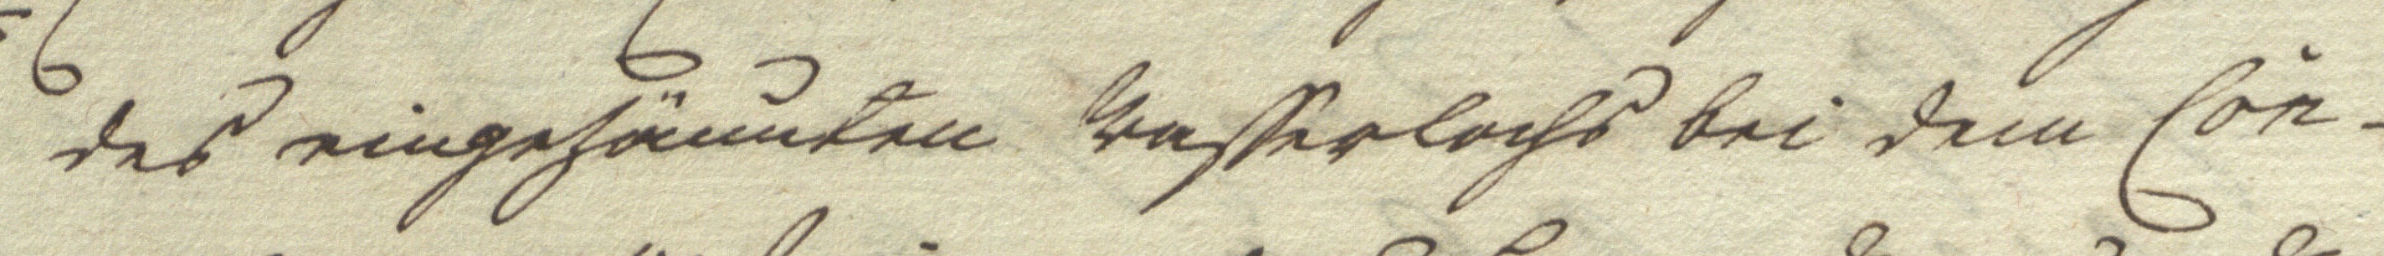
des eingezäunten Wasserlochs bei dem Con¬
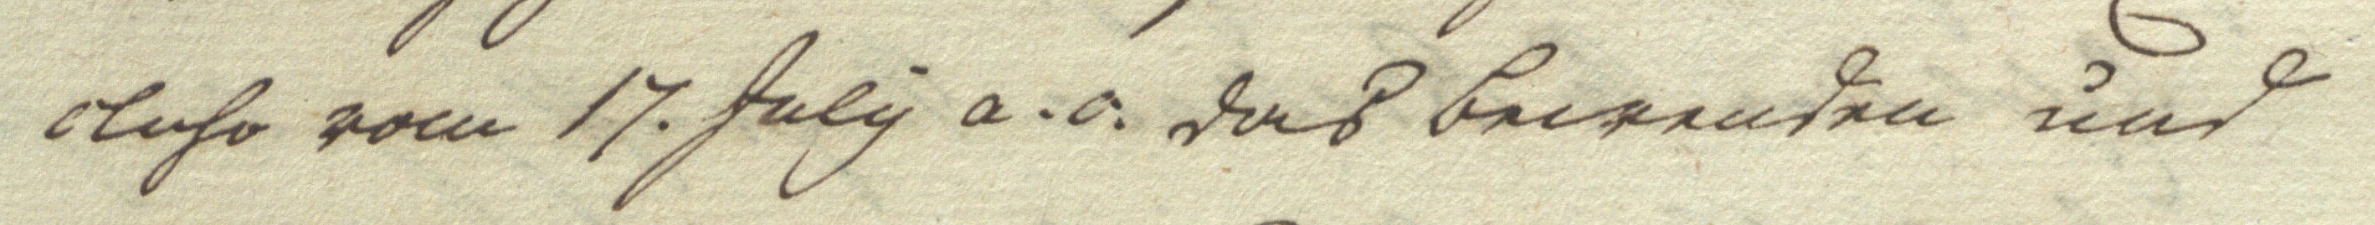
cluso vom 17. Julÿ a. c. das Bewenden und
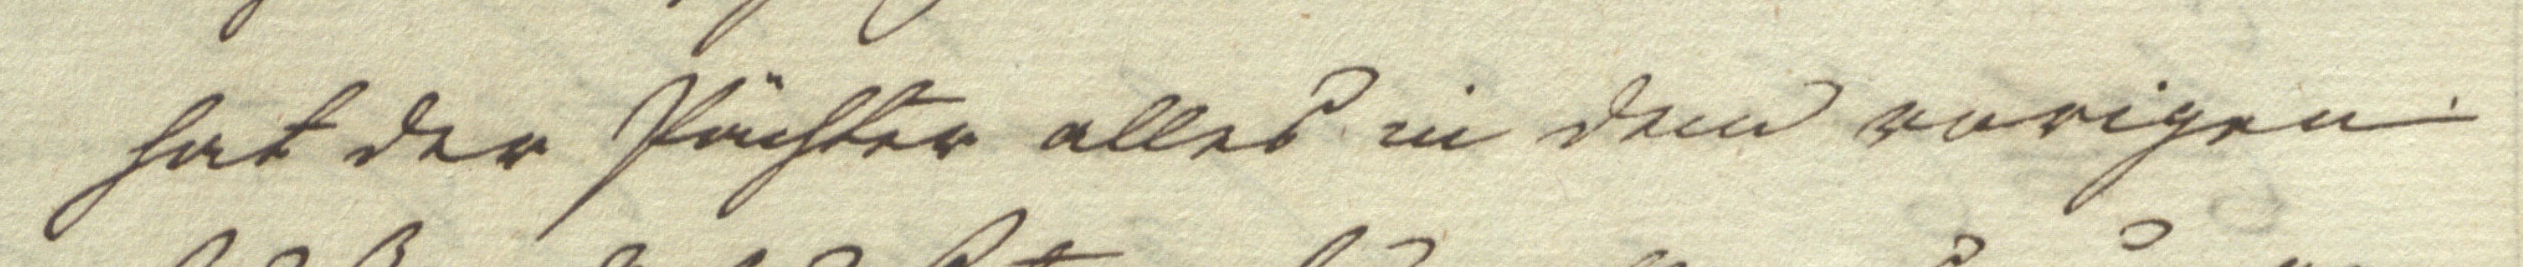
hat der Pächter alles in dem vorigen
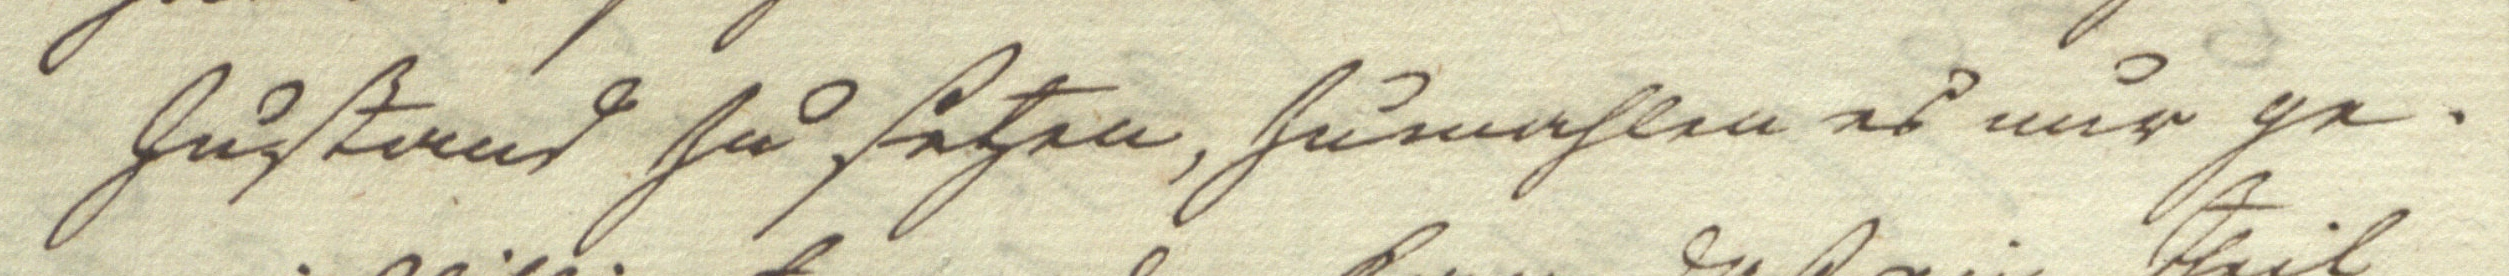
Zustand zu setzen, zumahlen es nur ge¬
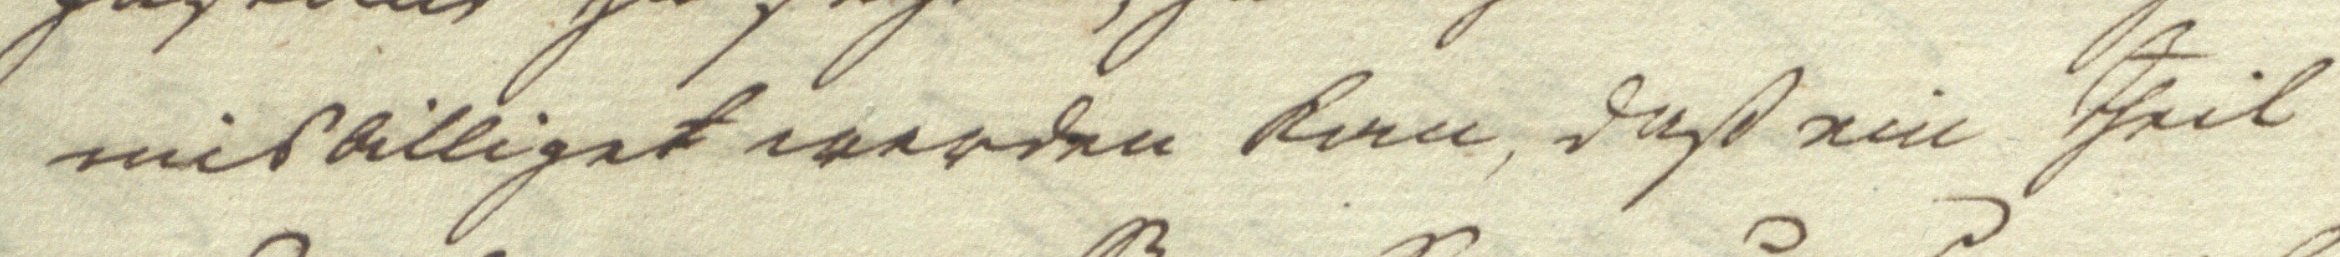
misbilliget werden kan, daß ein Theil
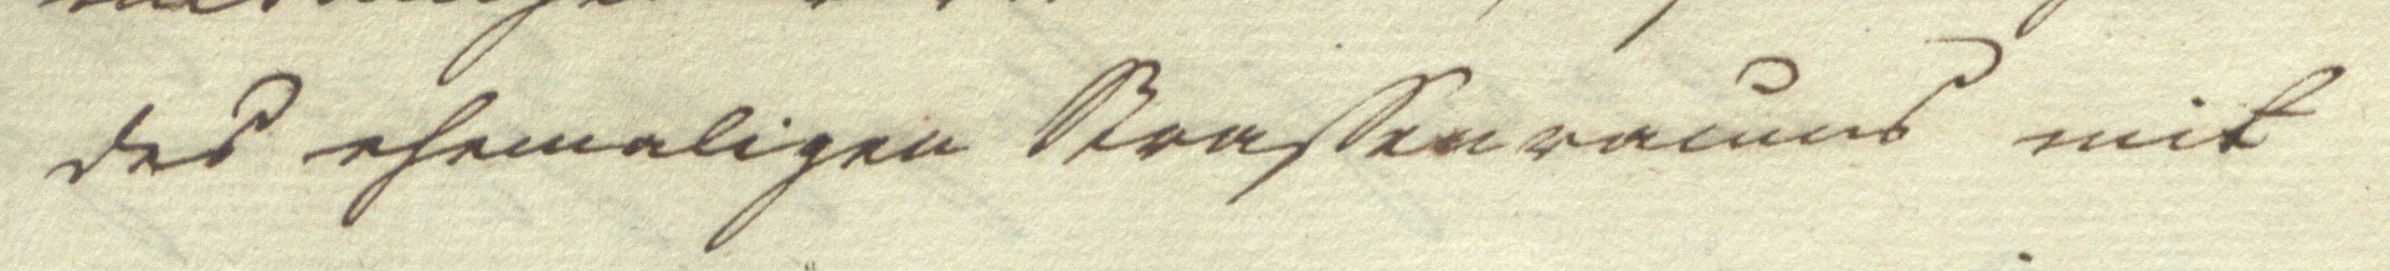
des ehemaligen Strassenraums mit
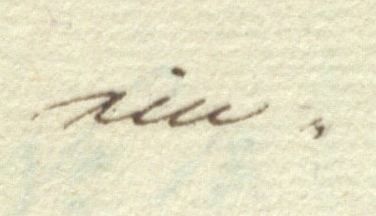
ein
